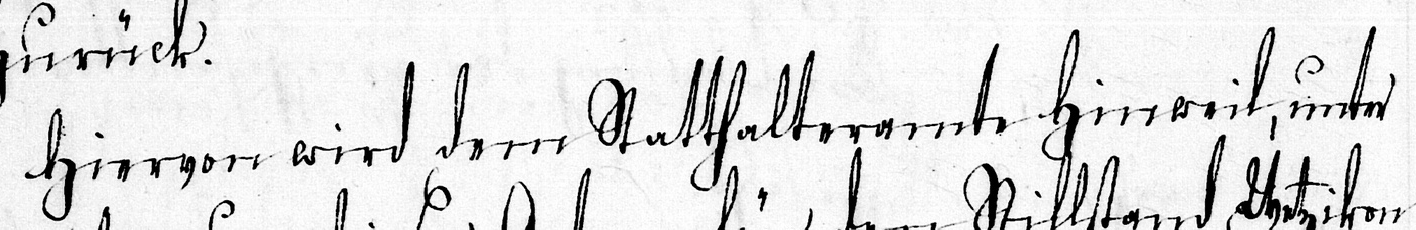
Hiervon wird dem Statthalteramte Hinweil, unter
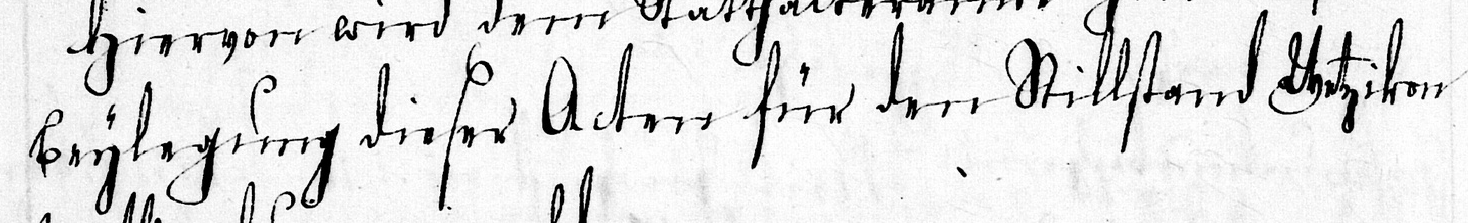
Beylegung dieser Acten für den Stillstand Wetzikon
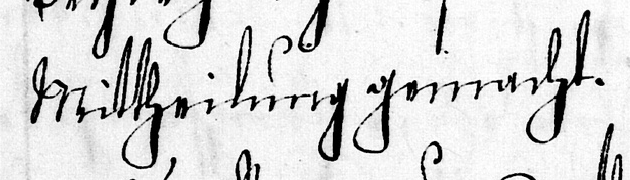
Mittheilung gemacht.
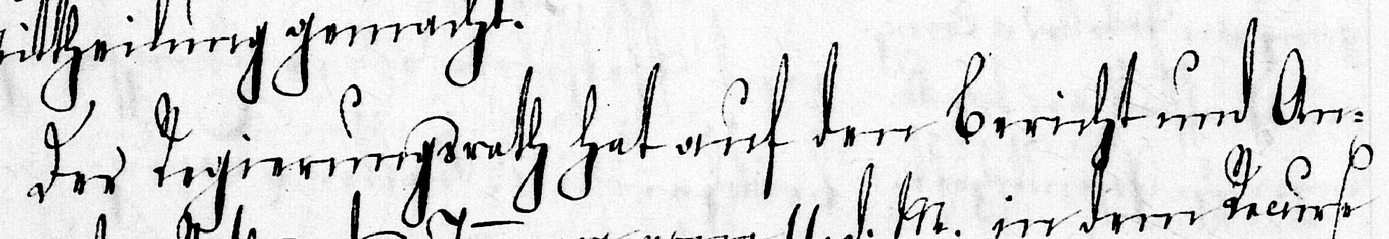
Der Regierungsrath hat auf den Bericht und An¬
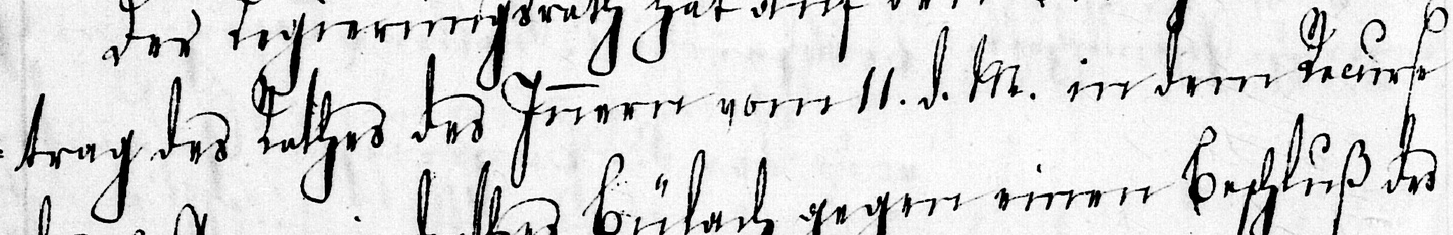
trag des Rathes des Innern vom 11. d. M. in dem Recurse
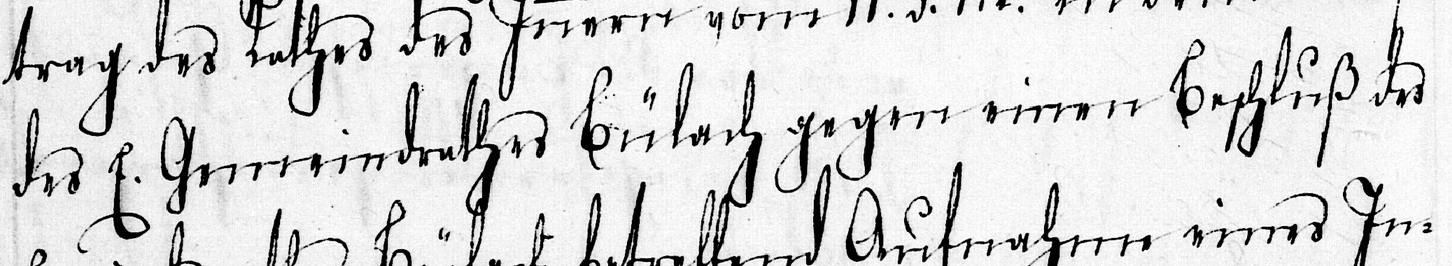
des E. Gemeindrathes Bülach gegen einen Beschluß des
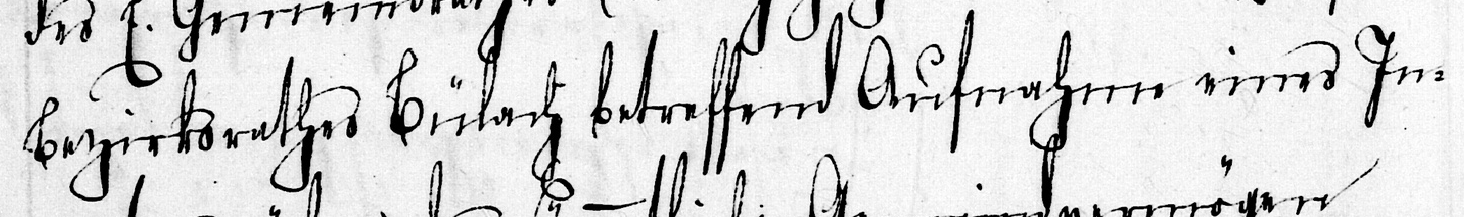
Bezirksrathes Bülach betreffend Aufnahme eines In¬
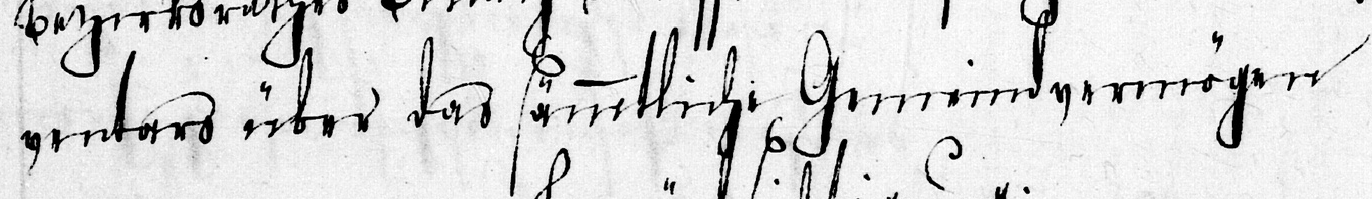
ventars über das sämmtliche Gemeindvermögen
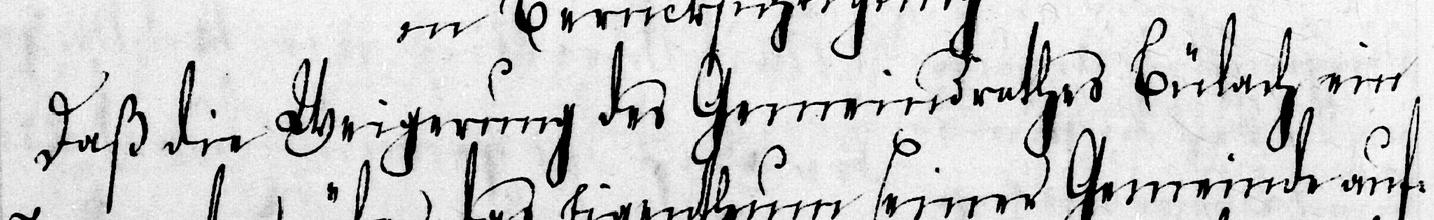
Daß die Weigerung des Gemeindrathes Bülach ein
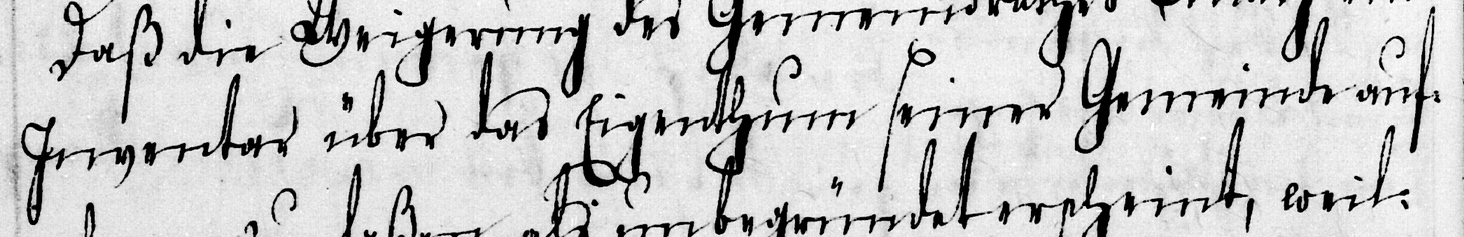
Inventar über das Eigenthum seiner Gemeinde auf¬
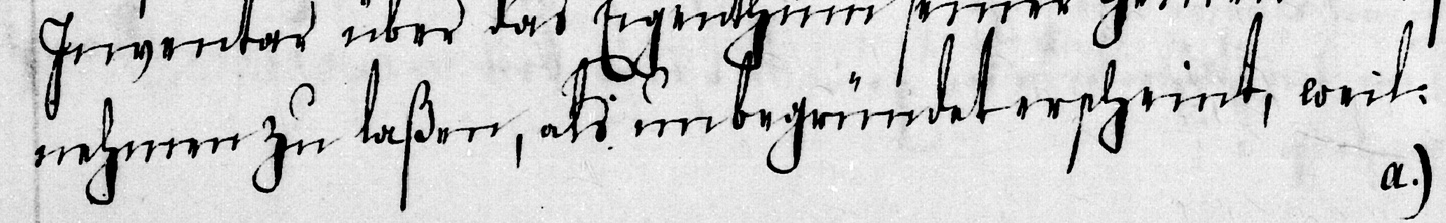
nehmen zu laßen, als unbegründet erscheint, weil:
